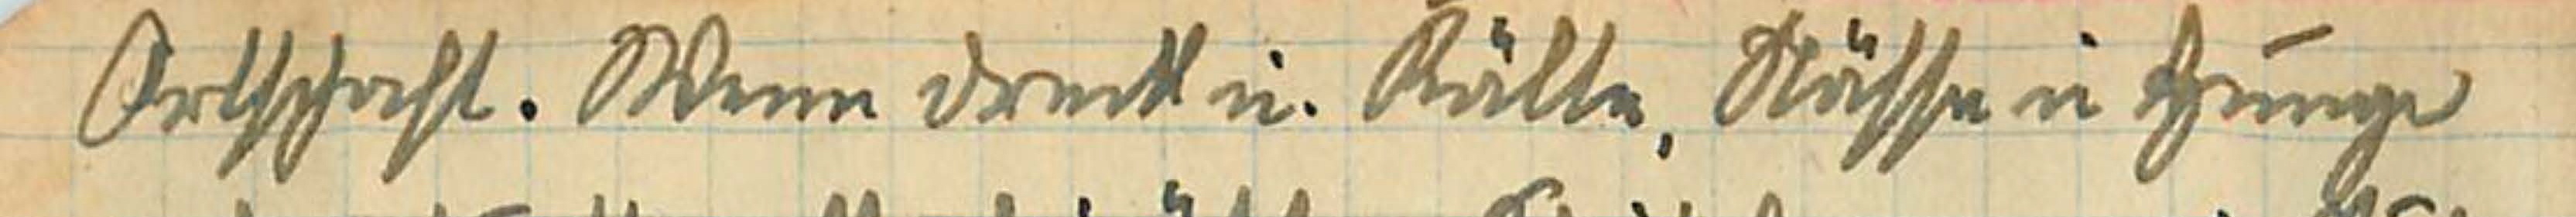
Ortschaft. Wenn Dreck u. Kälte, Nässe u. Hunger
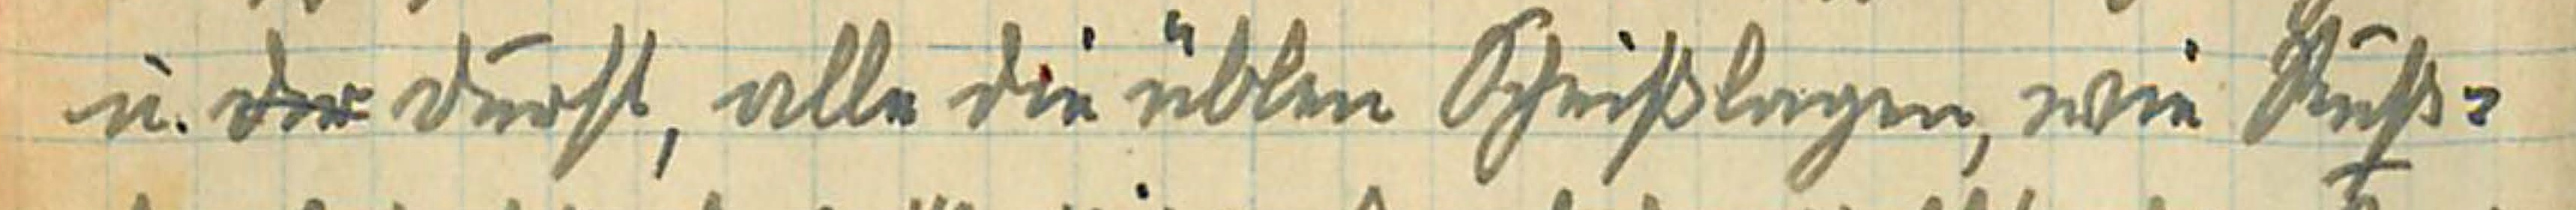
u. der Durst, alle die üblen Scheißlagen, wie Ruß-
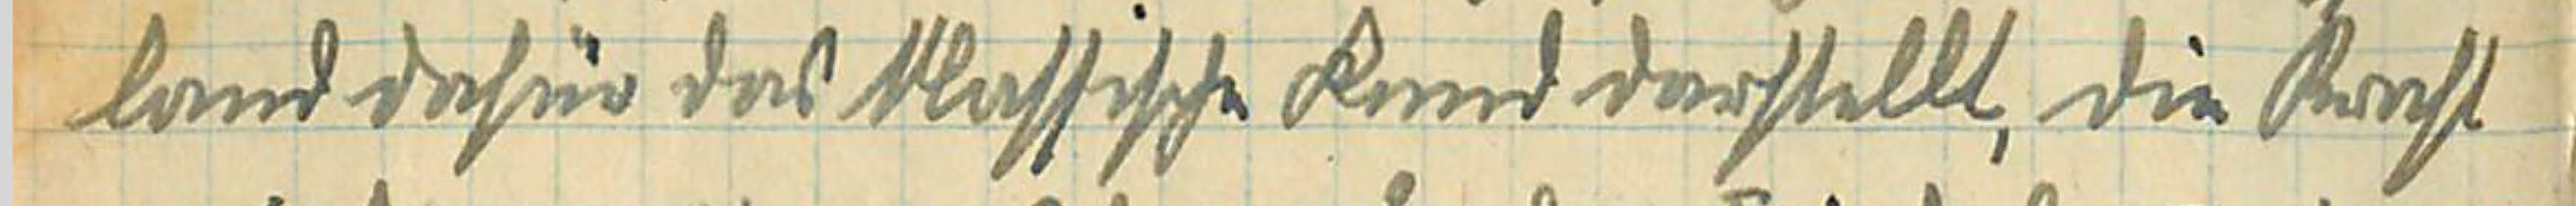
land dafür das klassische Land darstellt, die Kraft
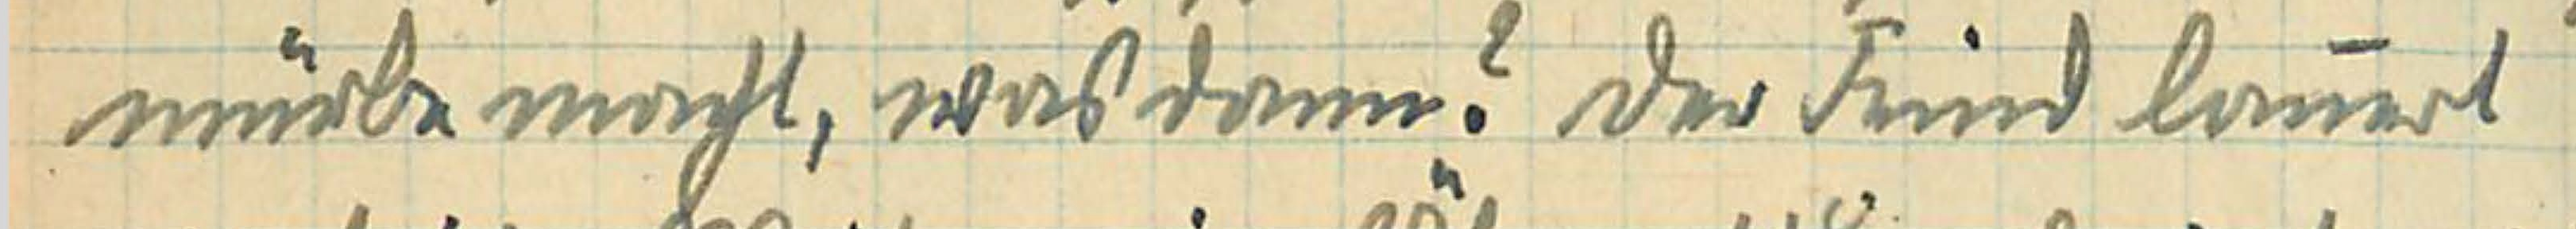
mürbe macht, was dann? Der Feind lauert
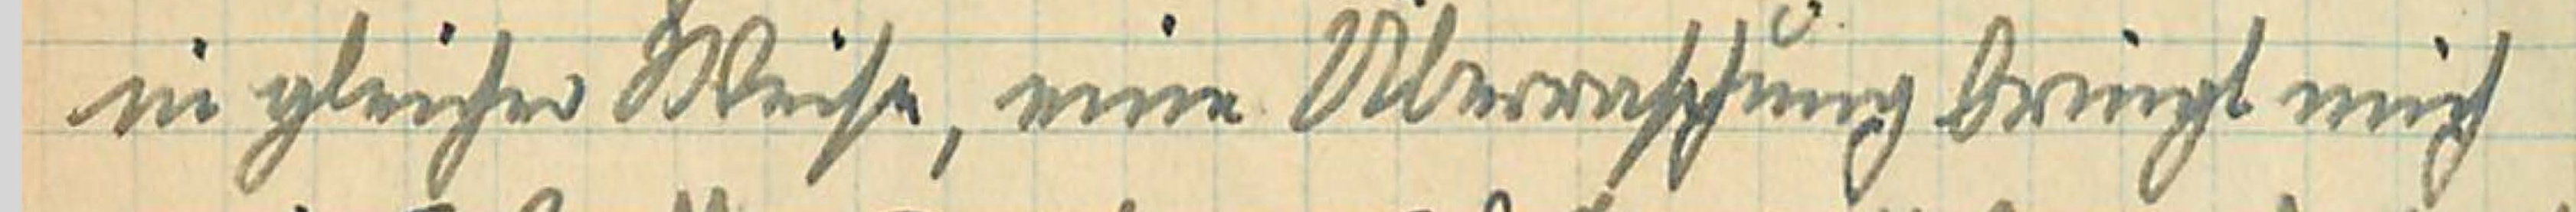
in gleicher Weise, eine Überraschung bringt mich
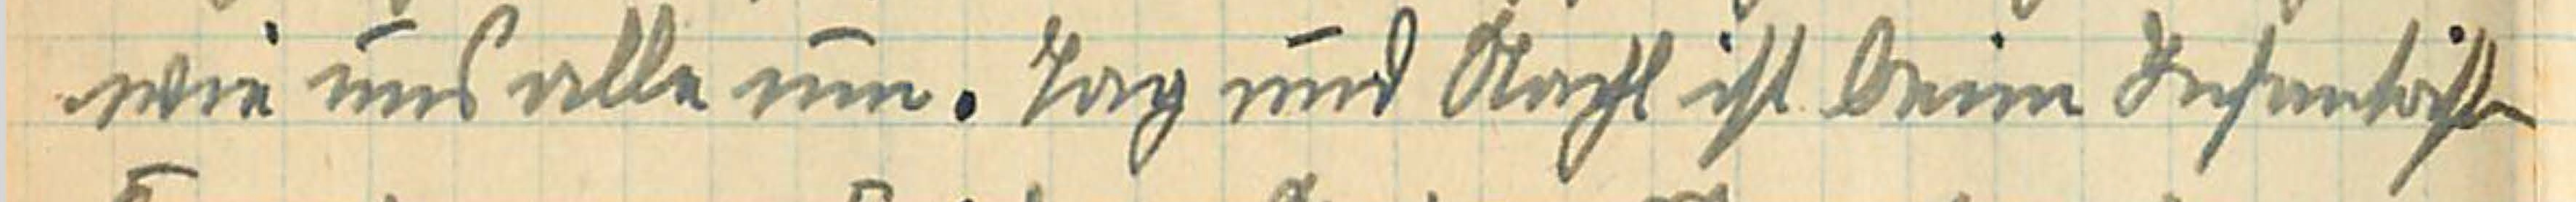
wie uns alle um. Tag und Nacht ist beim Infantristen
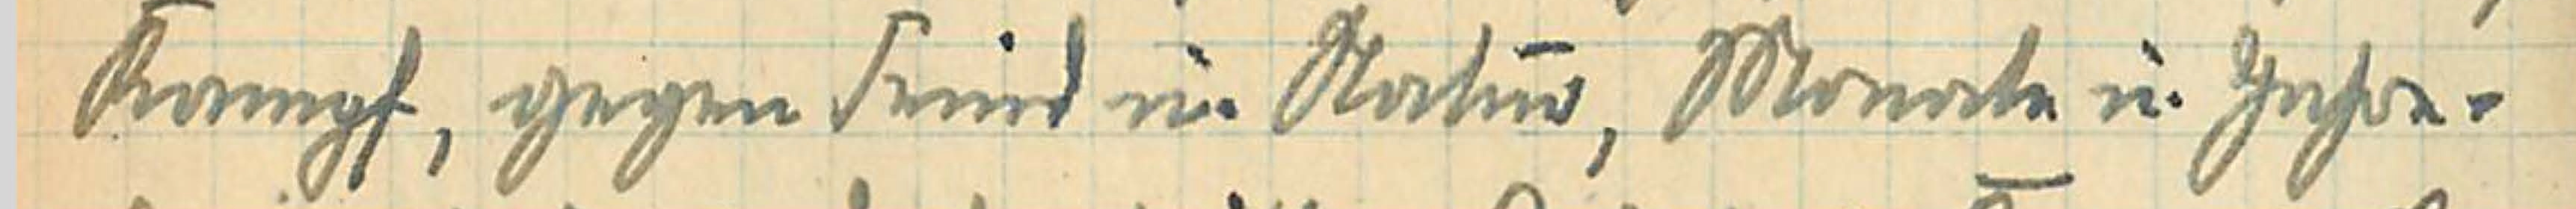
Kampf, gegen Feind u. Natur, Monate u. Jahre-
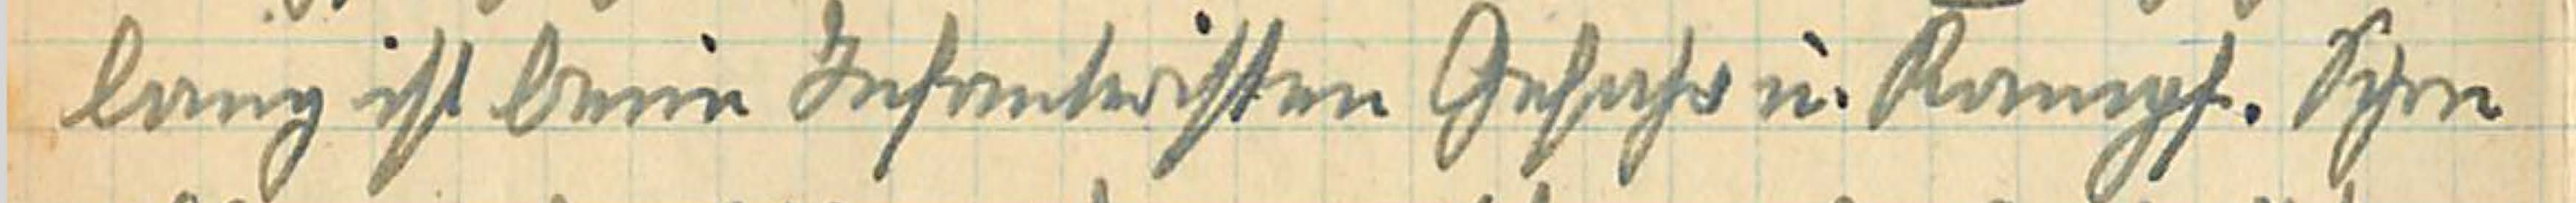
lang ist beim Infanteristen Gefahr u. Kampf. Schon
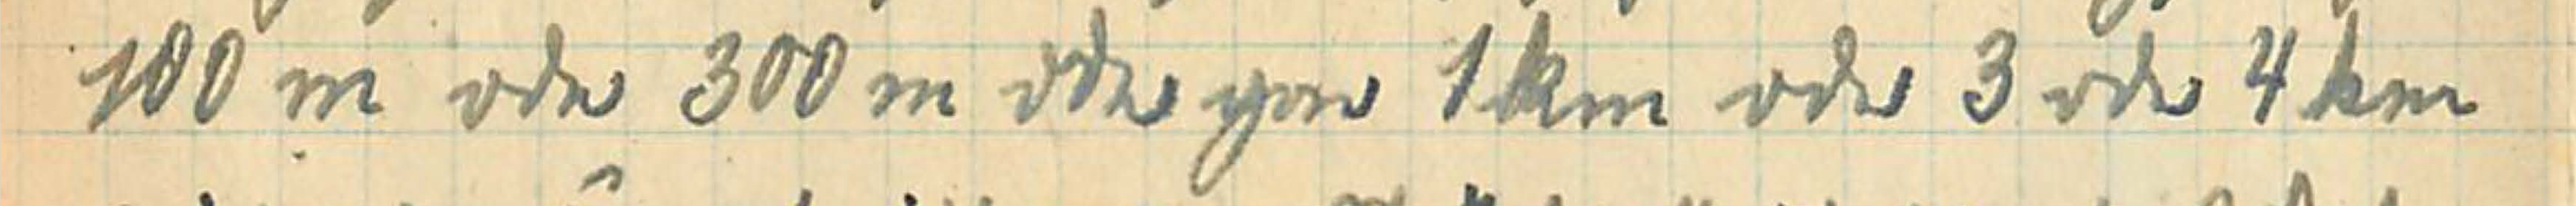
100 m oder 300 m oder gar 1 km oder 3 oder 4 km
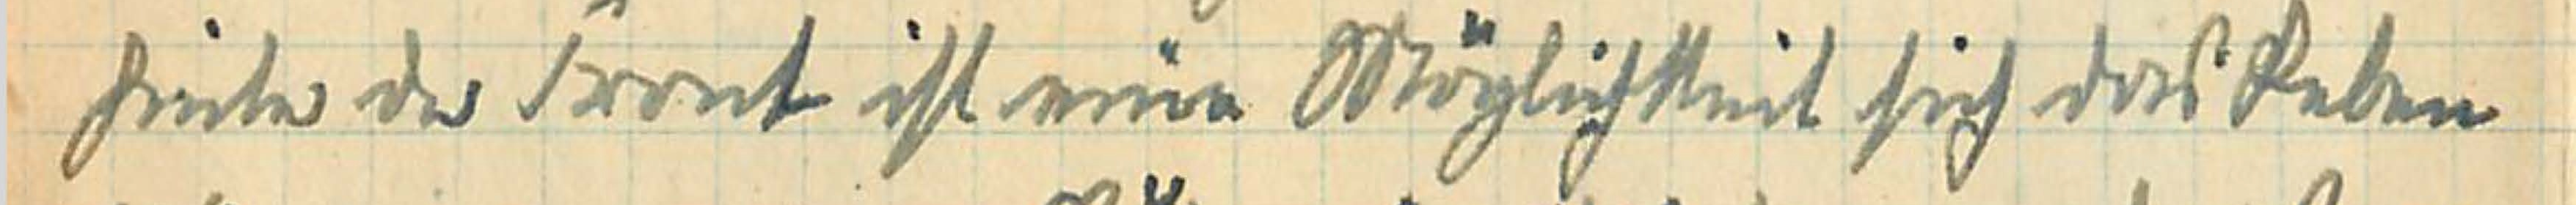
hinter der Front ist eine Möglichkeit sich das Leben
